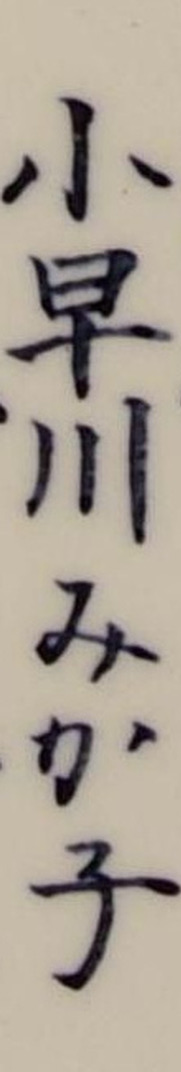小早川みか子
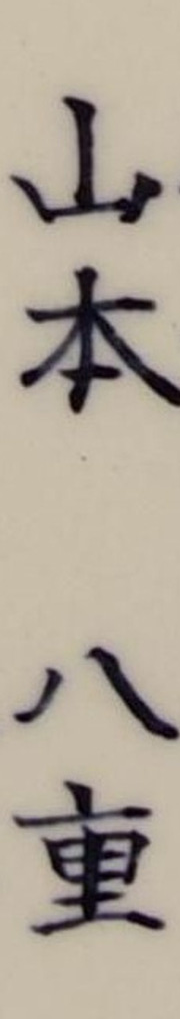山本八重
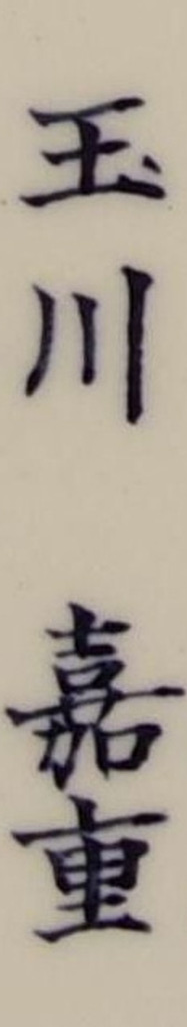玉川嘉重
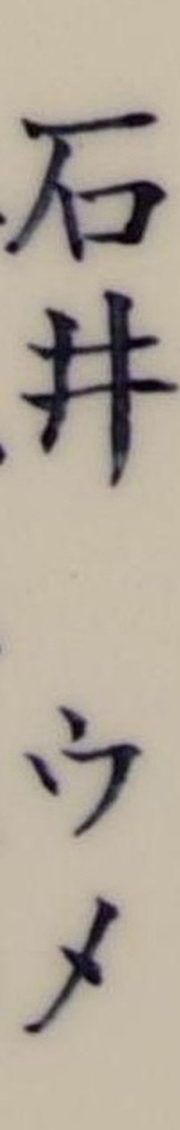石井ウメ
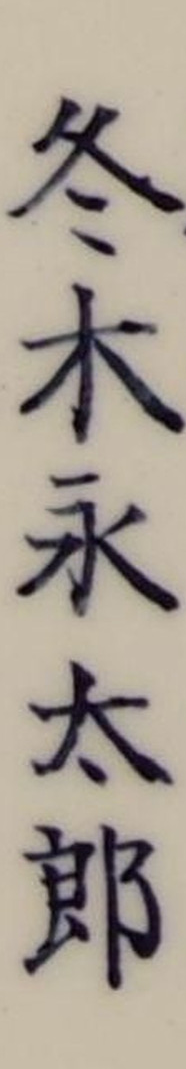冬木永太郎
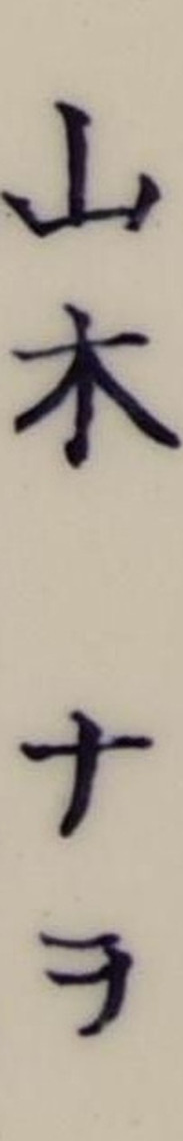山木ナヲ
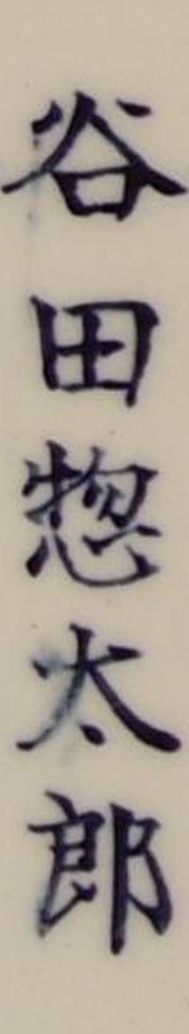谷田惣太郎
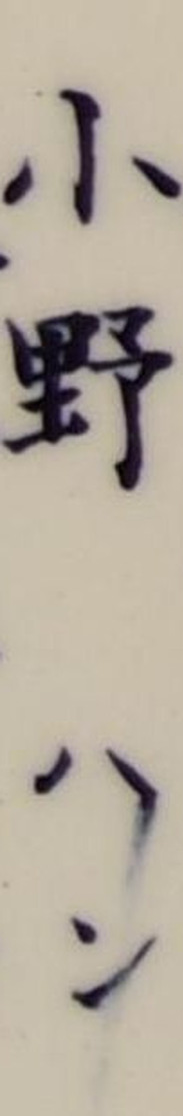小野ハン
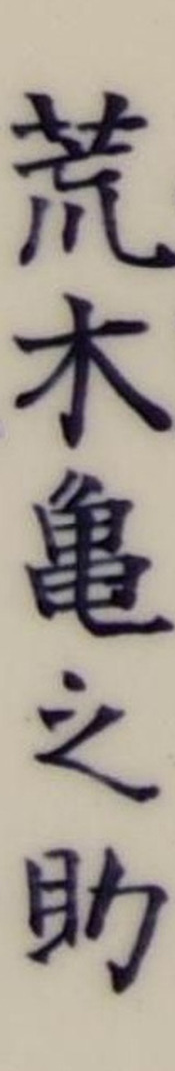荒木亀之助
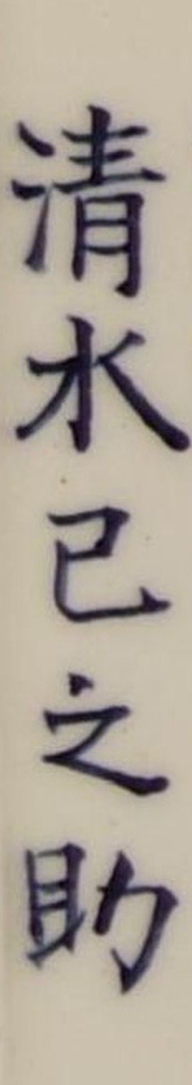清水巳之助

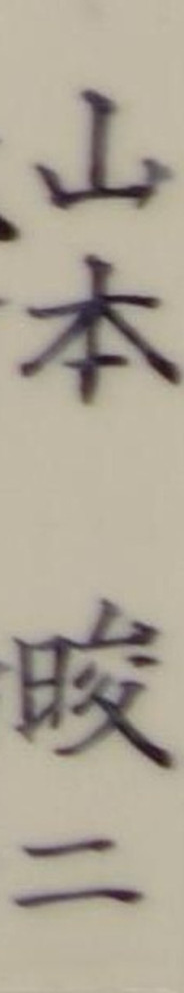山本晙二
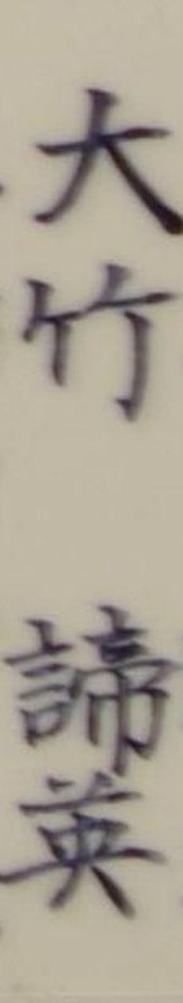大竹諦英
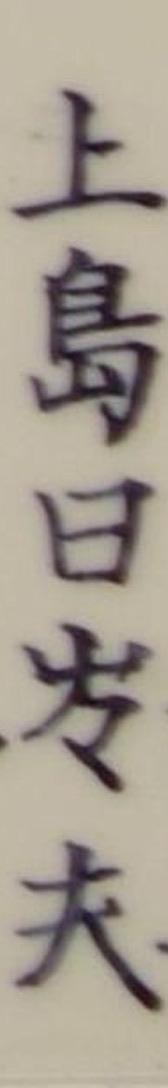上島日出夫
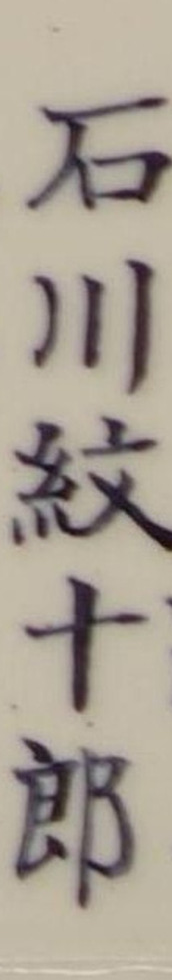石川紋十郎
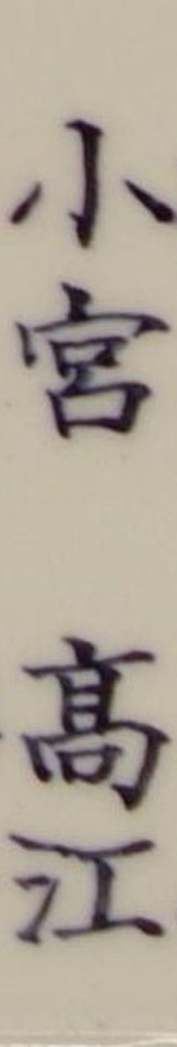小宮高江
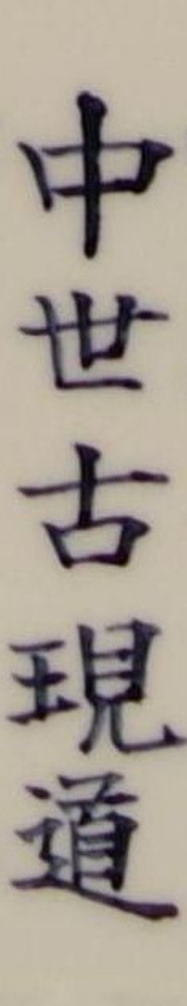中世古現道
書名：M~S
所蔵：高野山金剛峯寺
